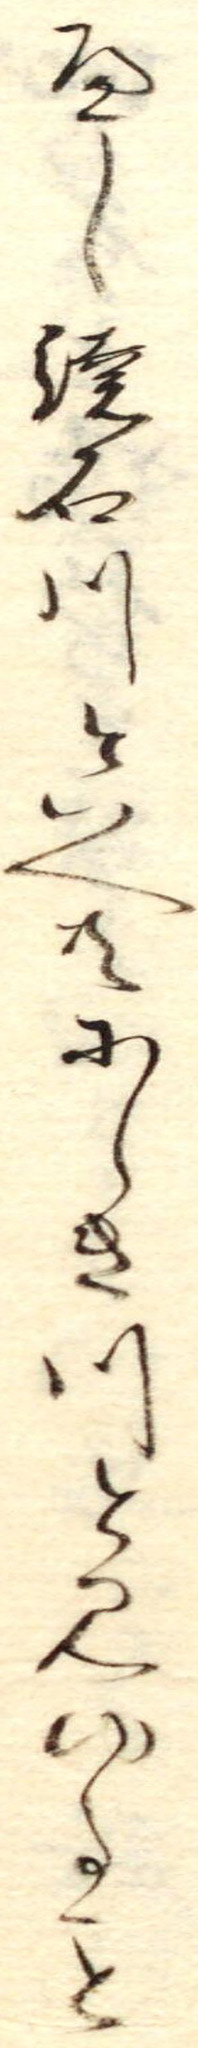へし饒石川といへ共にしき川と見ゆること
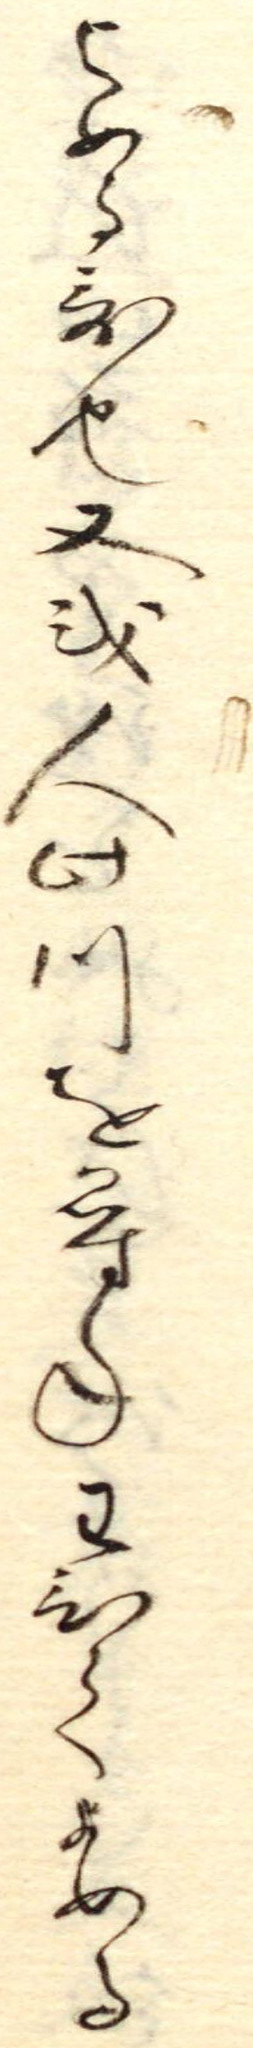よめる哥也又或人此川を尋ねわひてよめる
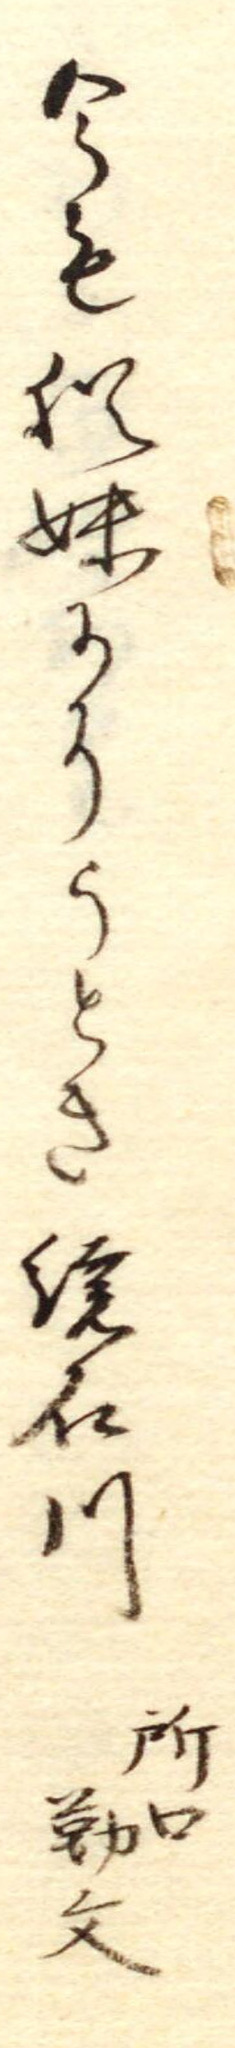今も猶妹にそうとき饒石川所口勤文
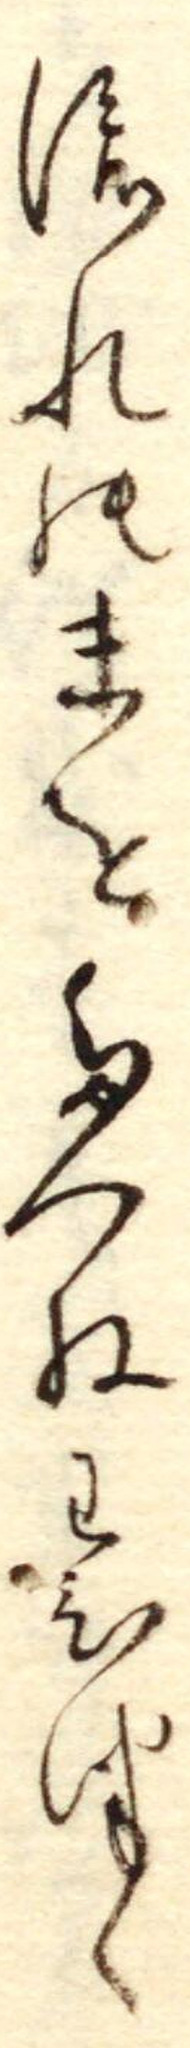流れの末をたつねわひつゝ
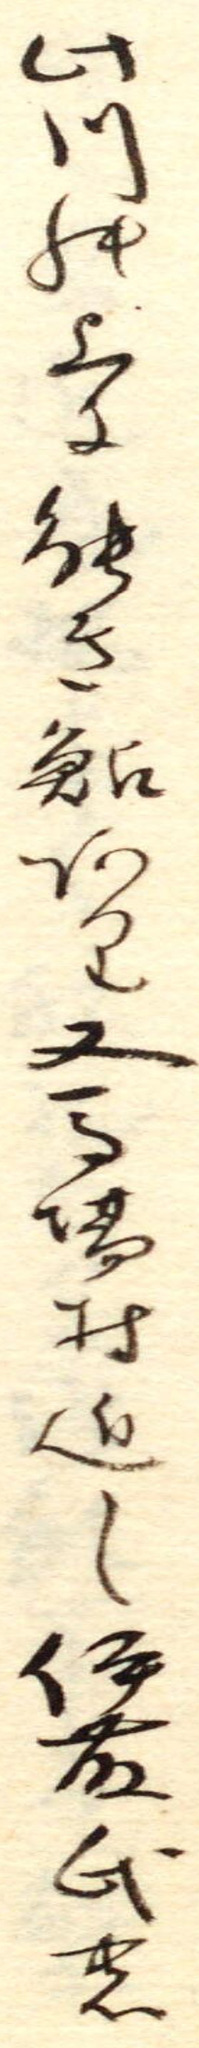此川の上に能き鮎あり又馬場村近し伊藤氏の
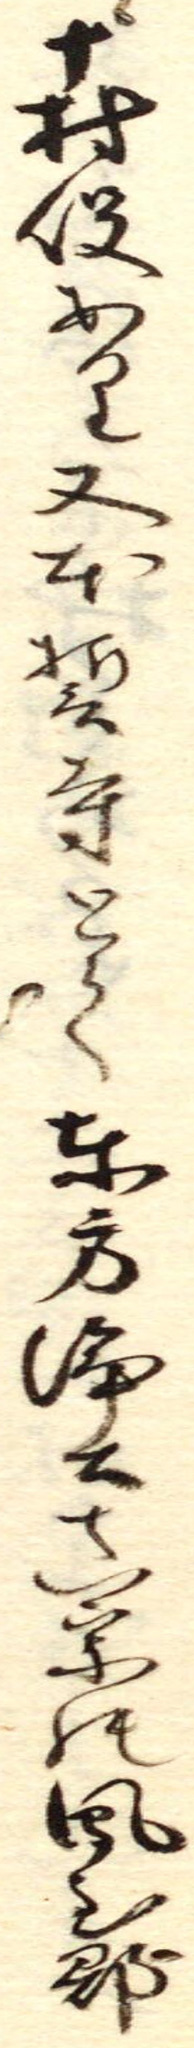十村役あり又本誓寺とて東方浄土真宗の鳳至郡
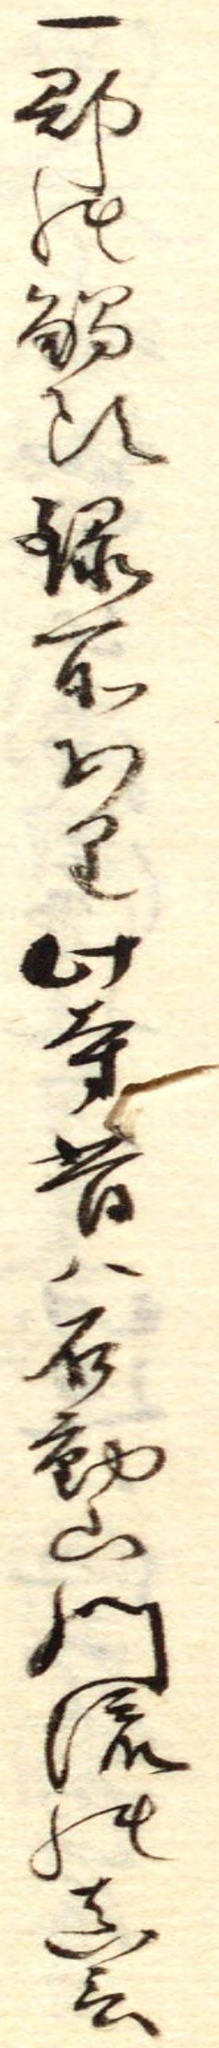一郡の触頭録所あり此寺昔は石動山門流の真言
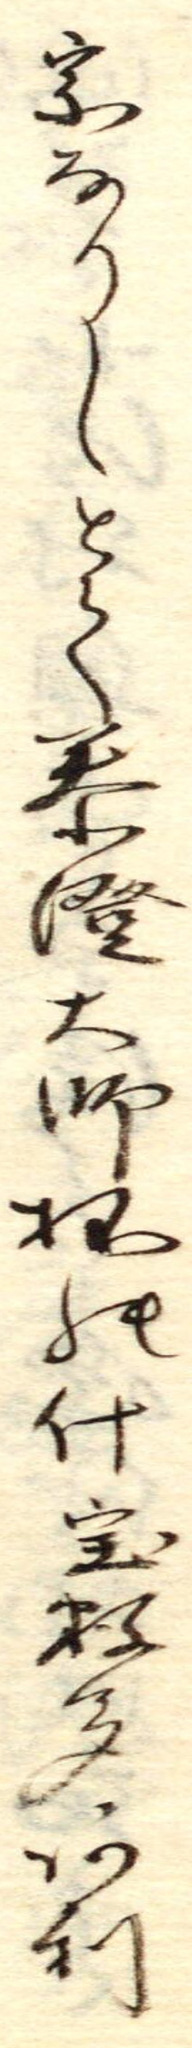宗なりしとて泰澄大師抔の什宝数多あり
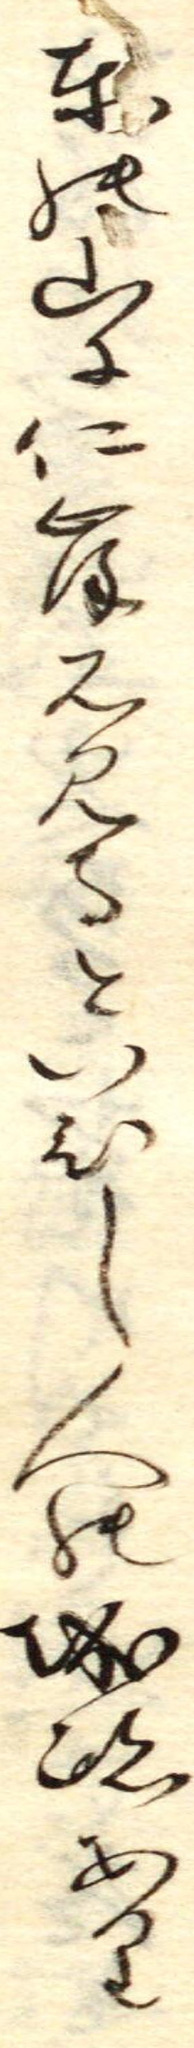東の山に仁岸石見守といひし人の城跡あり
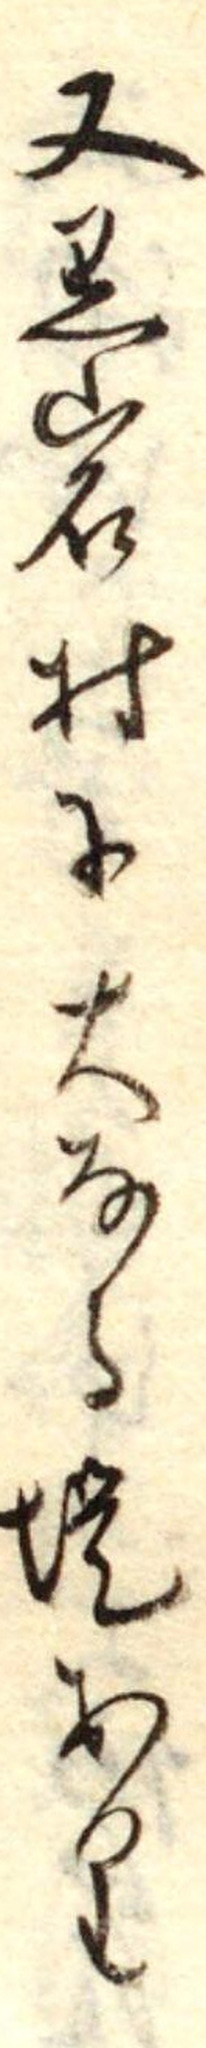又黒岩村に大なる堤あり

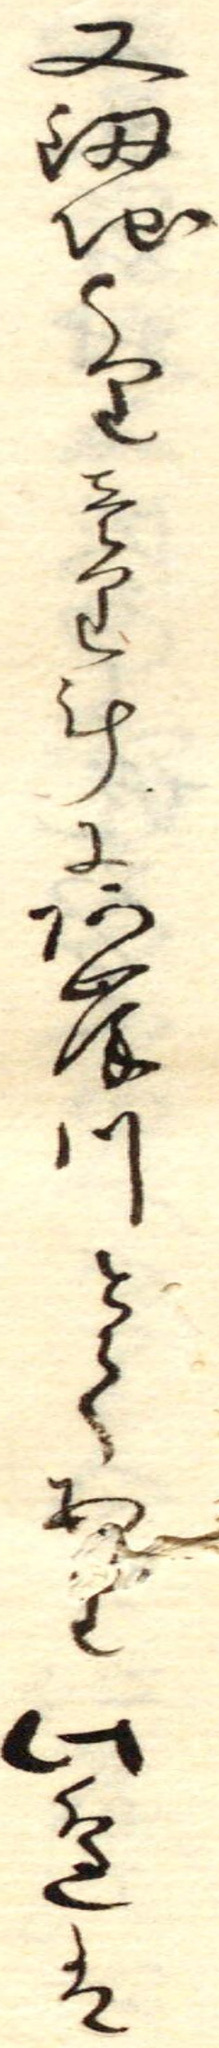又釼地より壱里計に阿岸川とてあり此辺は
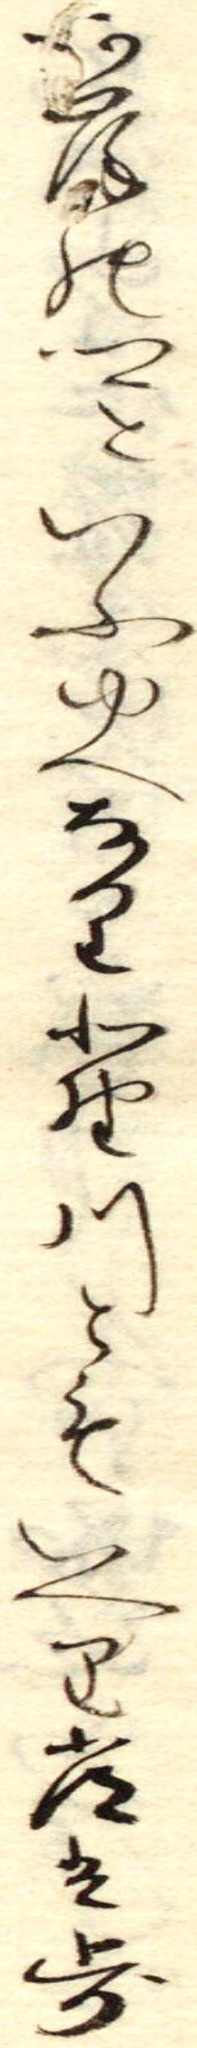阿岸の郷といふゆへなり北野川ともいへり常は歩
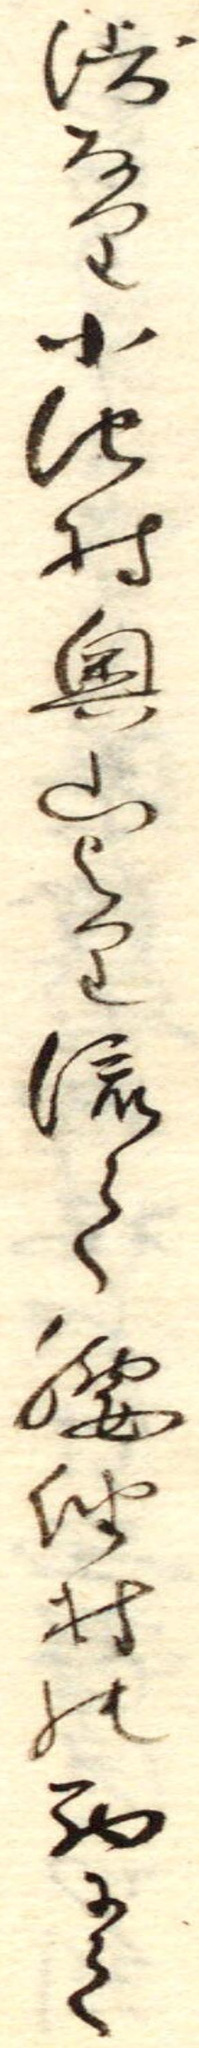渉なり小池村奥山より流て腰野村の西にて
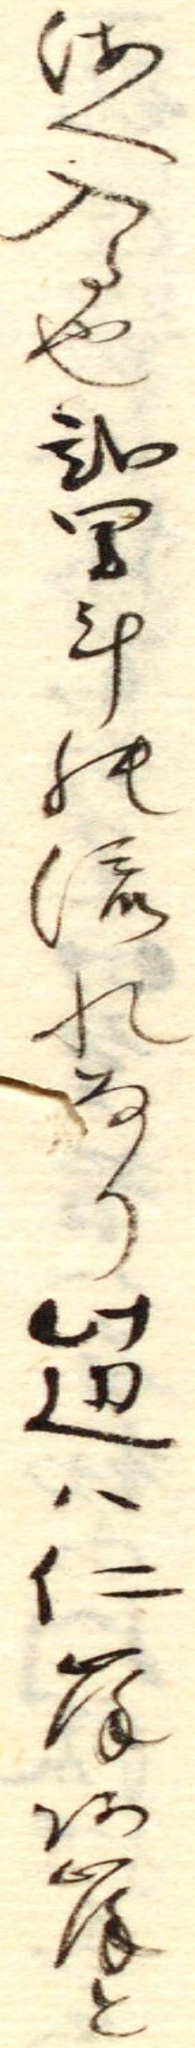海へ入る也弐里計の流れなり此辺は仁岸阿岸と
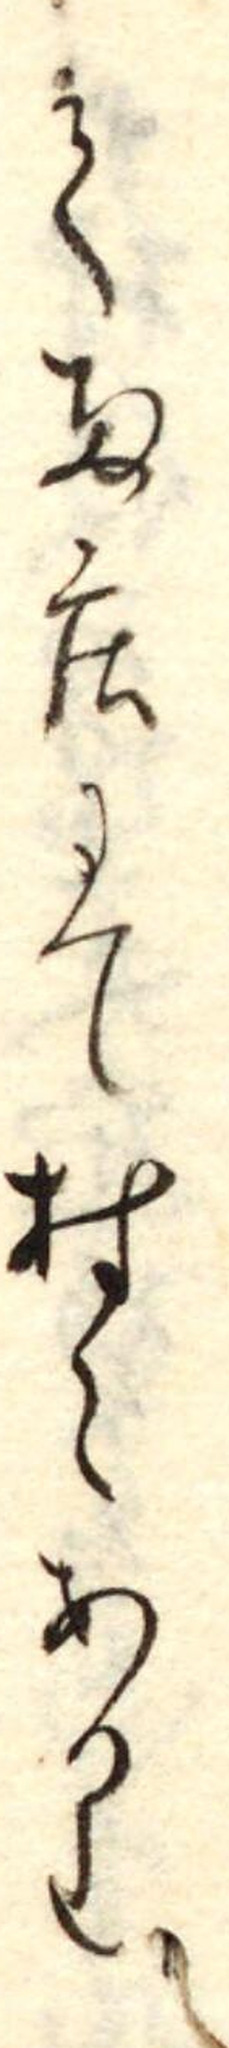て両庄にて村々あり
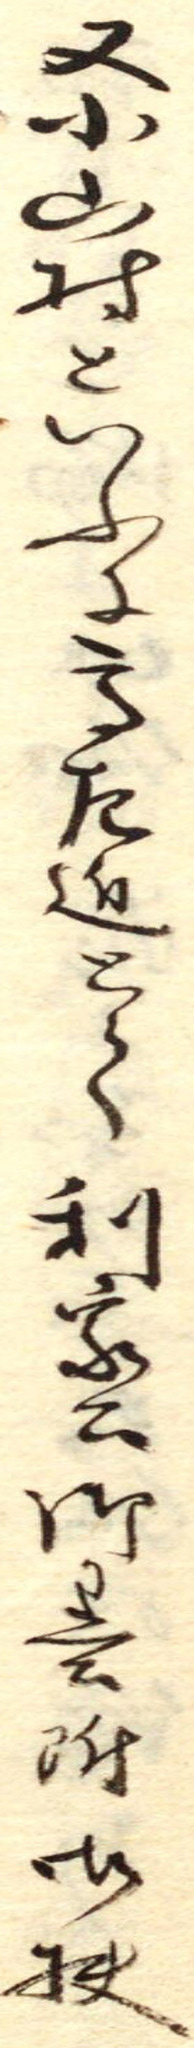又小山村といふに高左近とて利家公御墨附御扶
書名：能登名跡誌
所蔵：Ishikawa Prefectural Library
